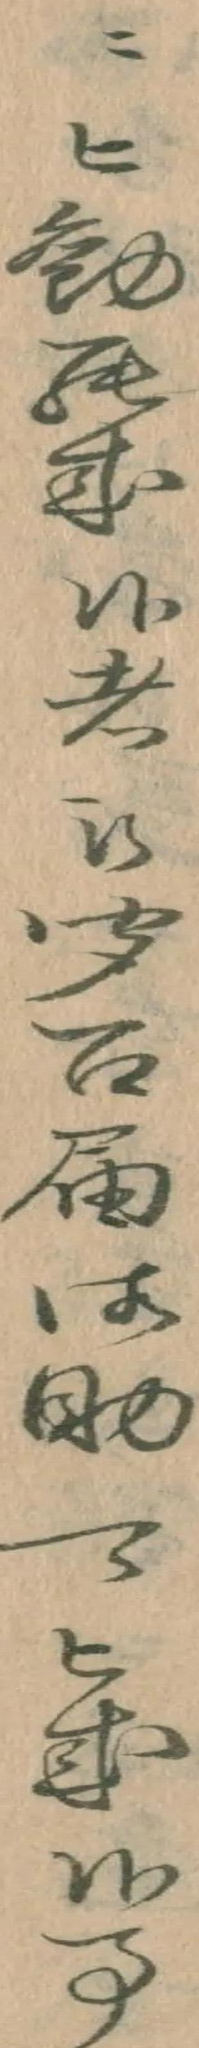に被勧罷成候者被聞召届御助可被成候事
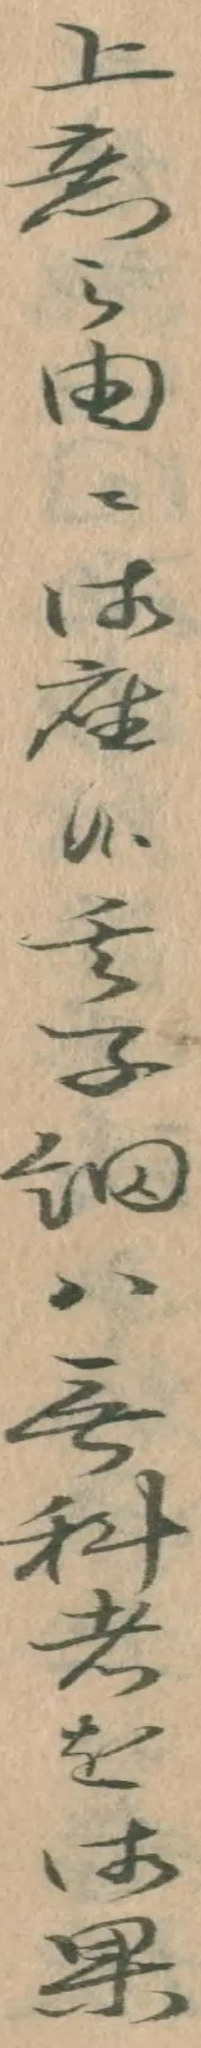上意之由に御座候其子細は無科者を御果
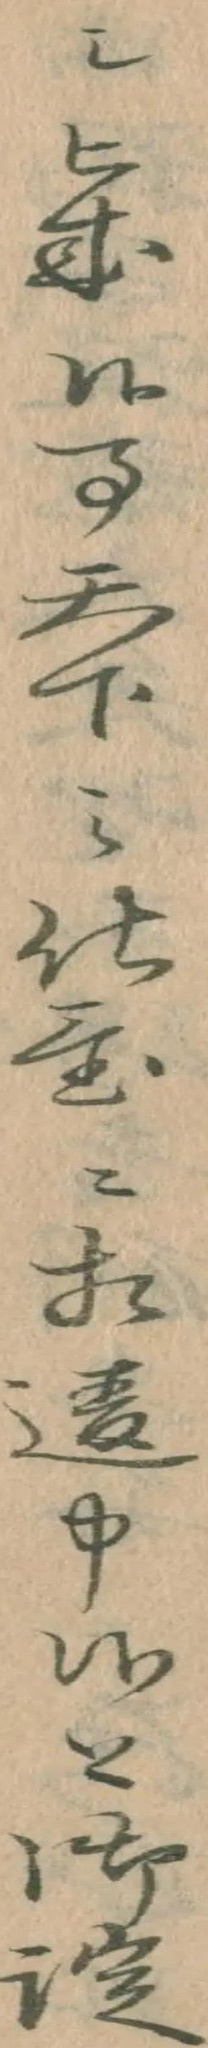し被成候事天下之仕置に相違申候と御諚
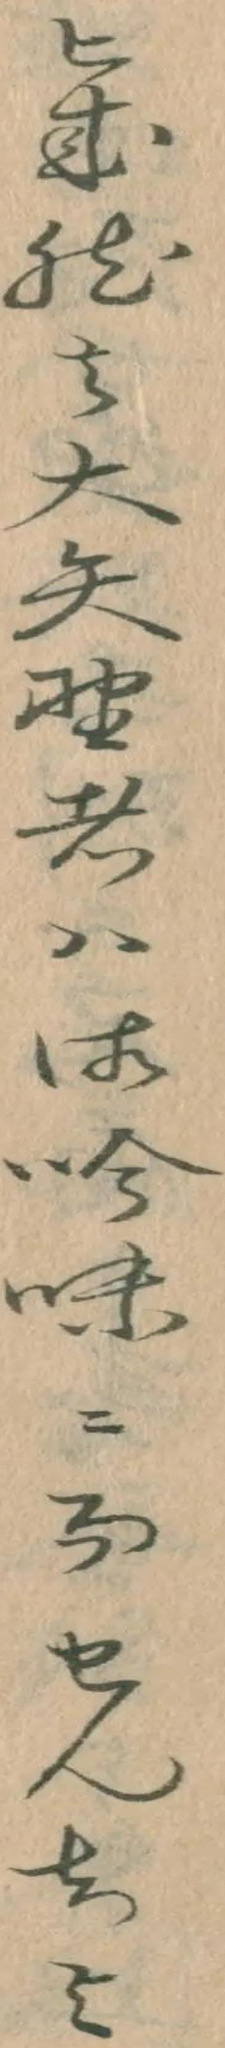被成然者大矢野者は御吟味に而せんち与
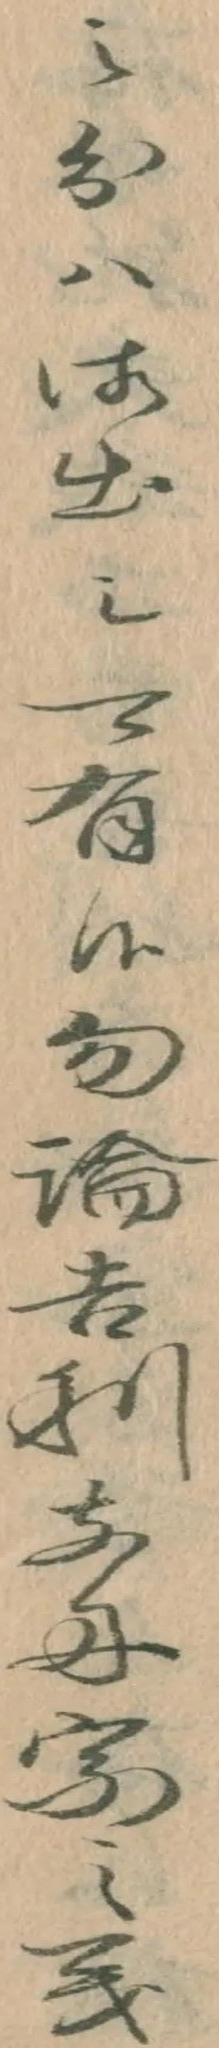之分は御出し可有候勿論吉利支丹宗之義
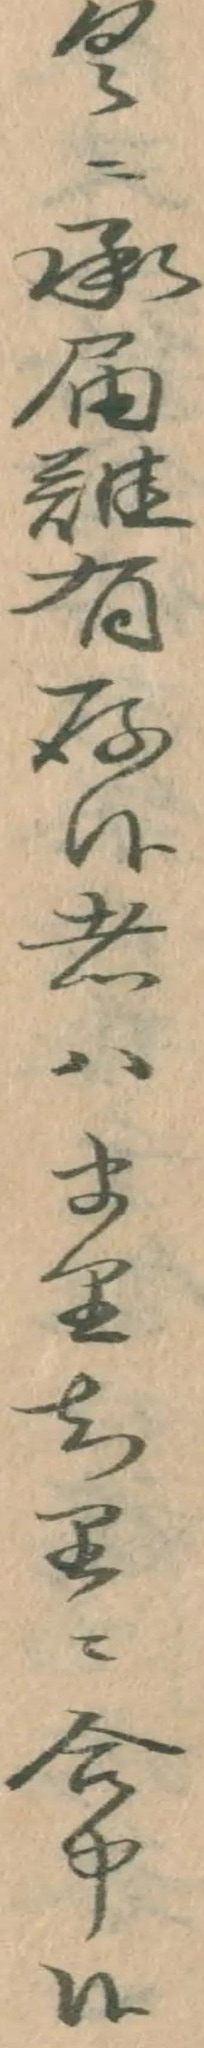具に承届難有存候者はま里ち里に合申候

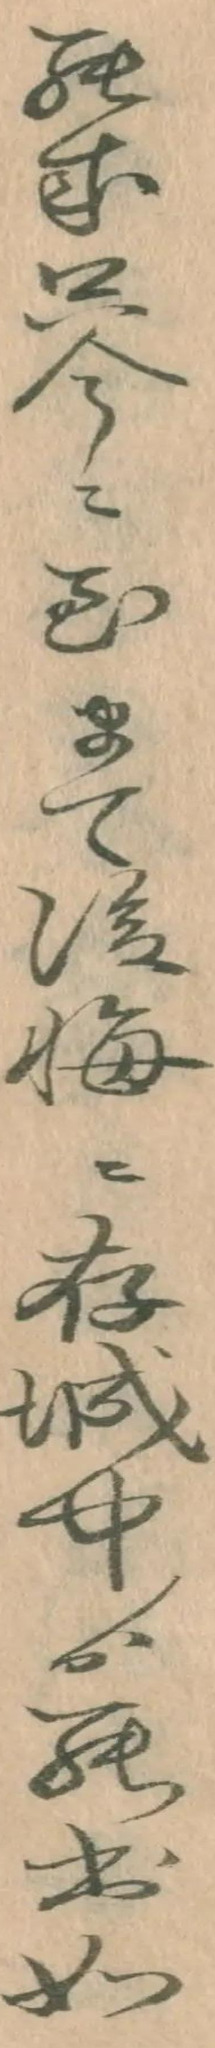罷成只今に至まて後悔に存城中ゟ罷出如
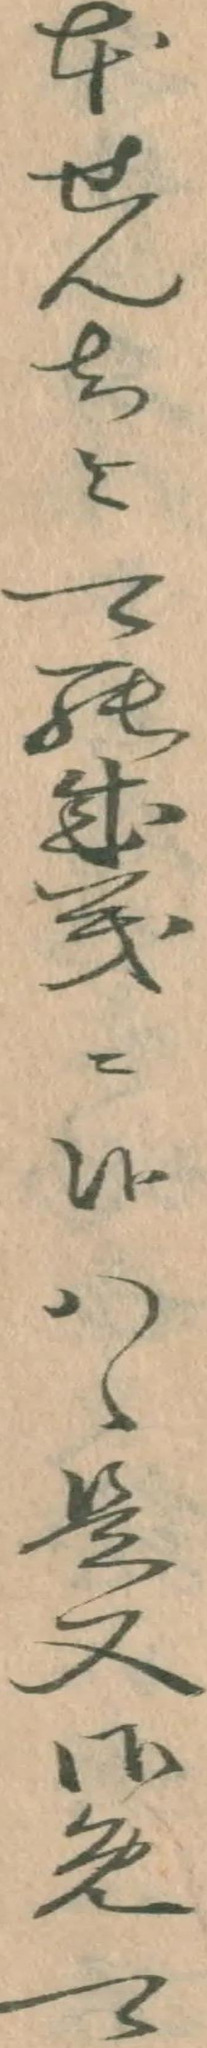本せんちと可罷成義に候はゝ是又御免可
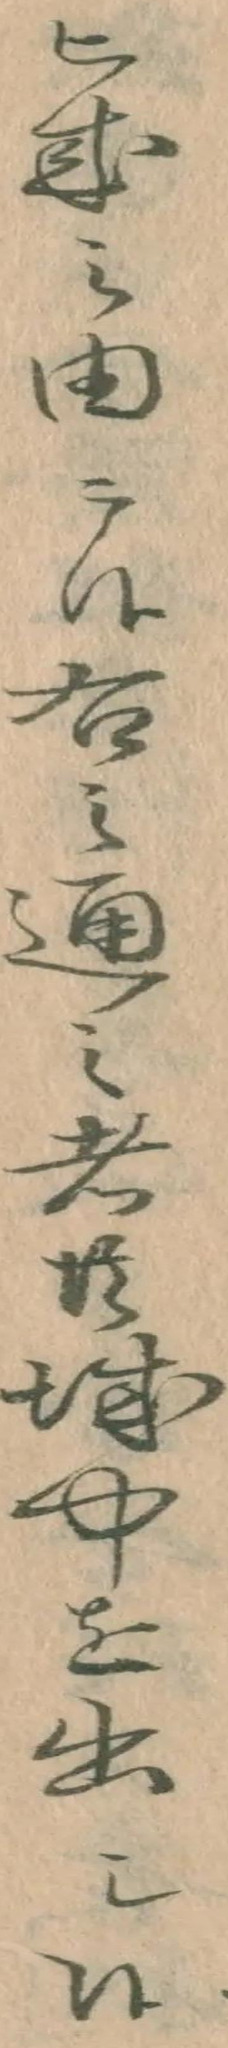被成之由に候右之通之者共城中を出し候
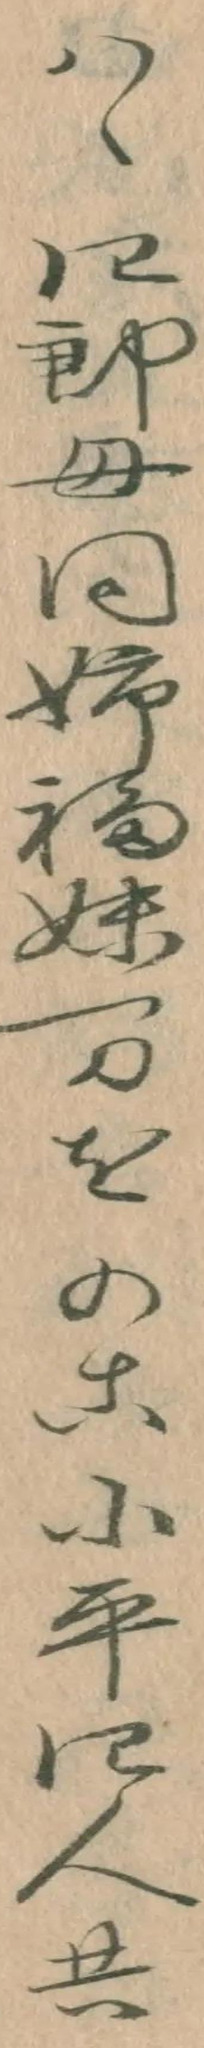はゝ四郎母同姉福妹万をの古小平四人共
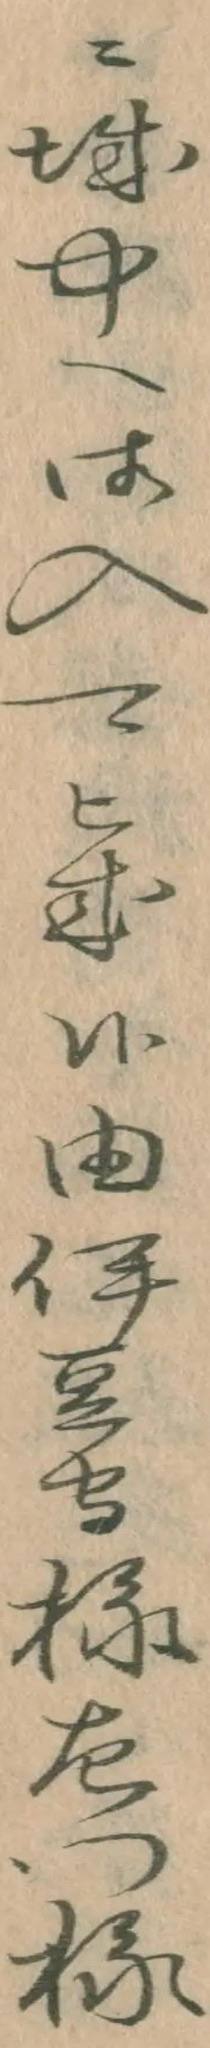に城中へ御入可被成候由伊豆守様左門様
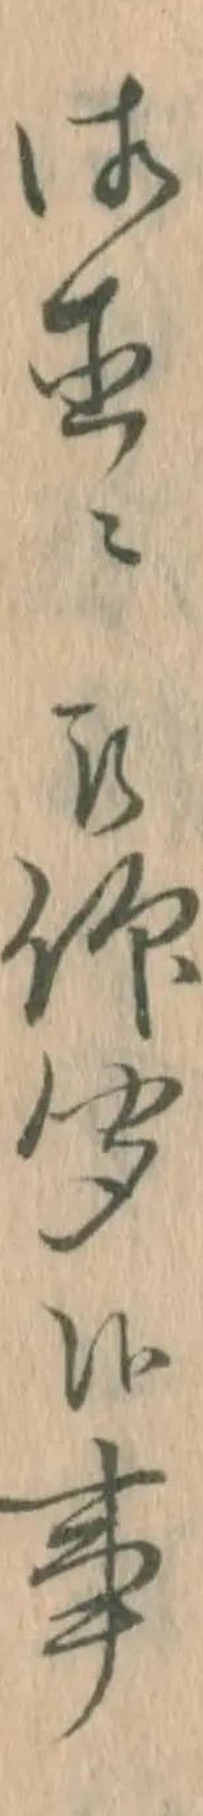御直に被仰聞候事
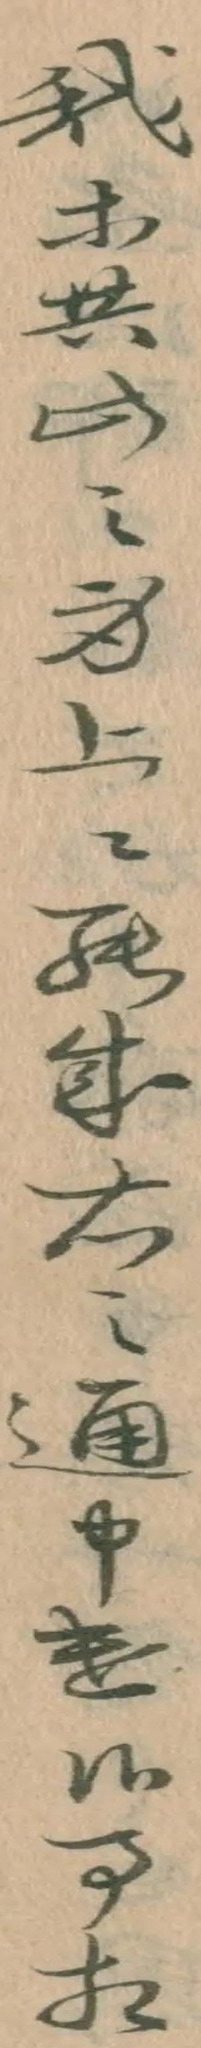一我等共此之身上に罷成右之通申遣候事相
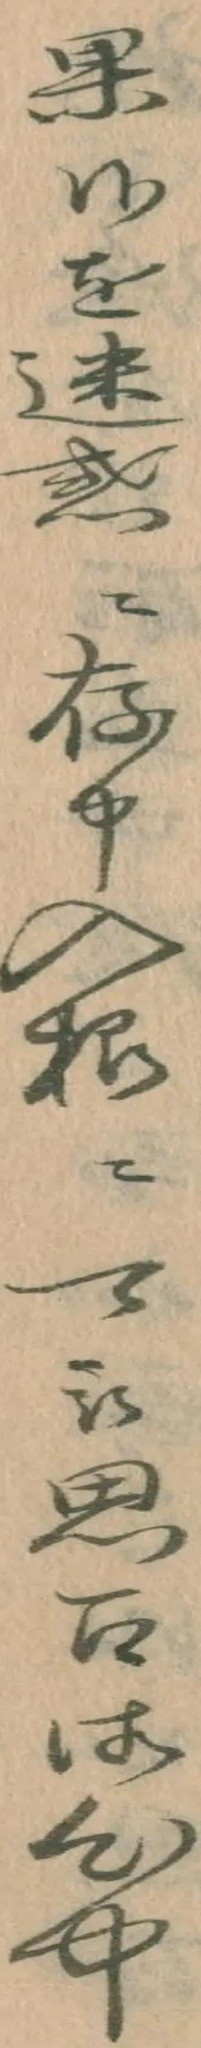果候を迷惑に存申入様に可被思召御心中
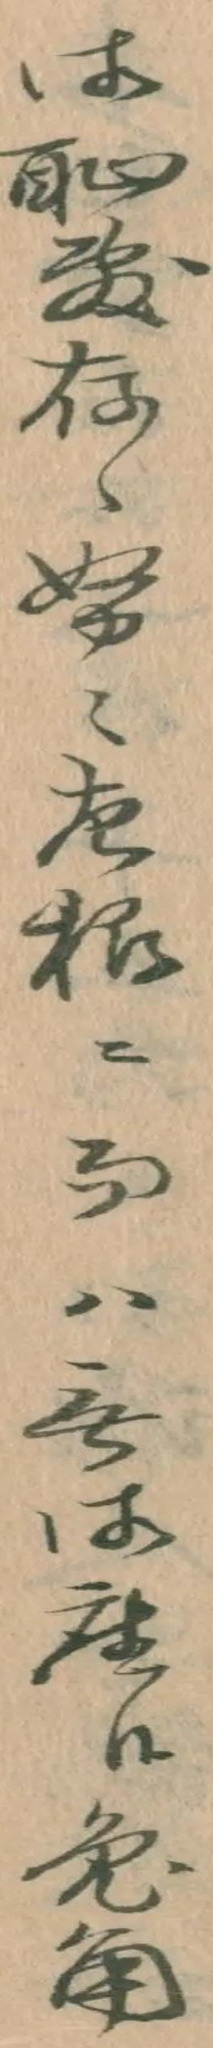御恥敷存候努々左様に而は無御座候兎角
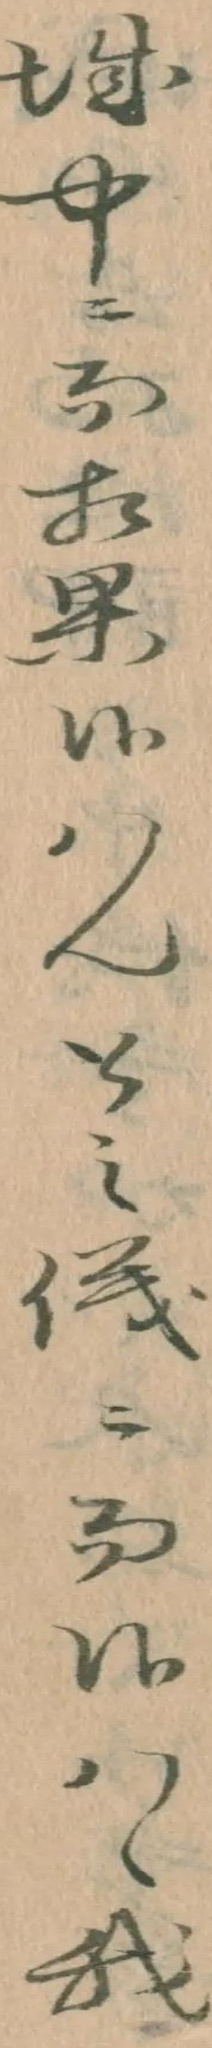城中に而相果候はんと之儀に而候はゝ我
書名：切支丹御退治記 49巻. [6]
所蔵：国立国会図書館 National Diet Library, JAPAN
